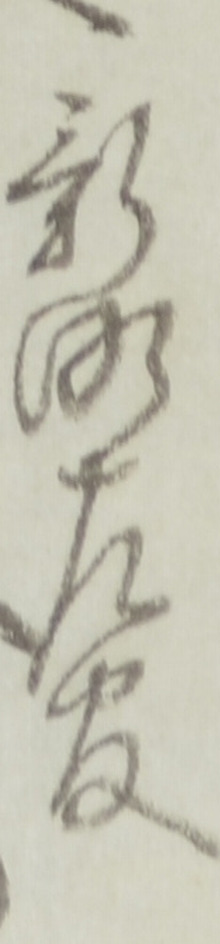新町左官
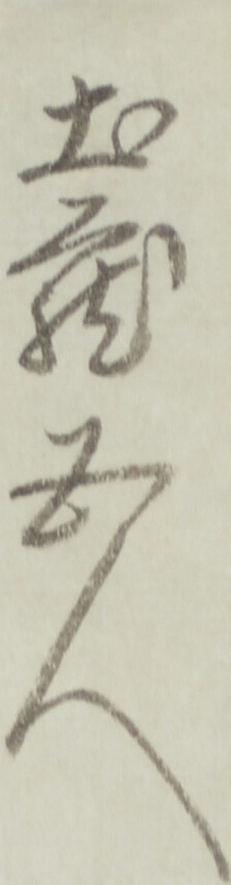土蔵五人
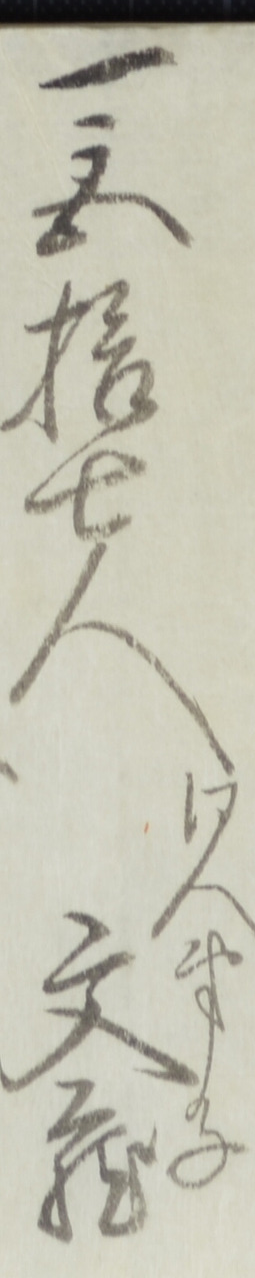一宮拾七人文蔵
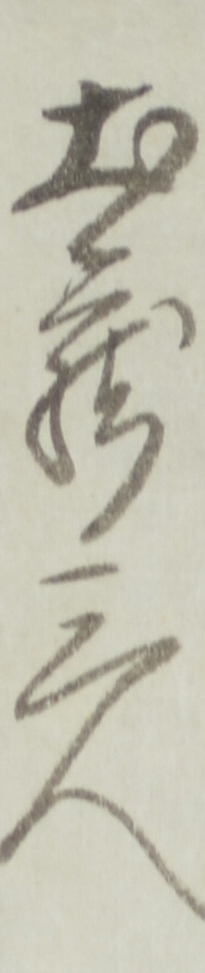土蔵三人
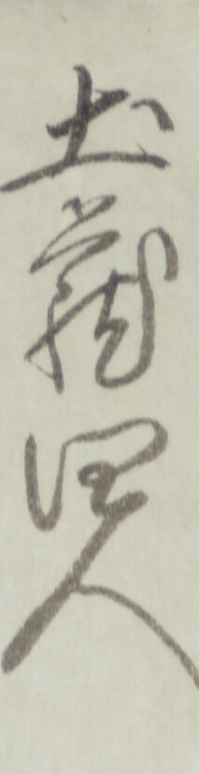土蔵四人
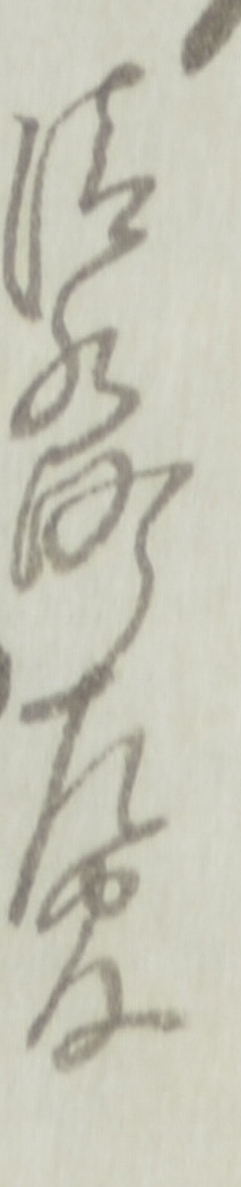清水町左官
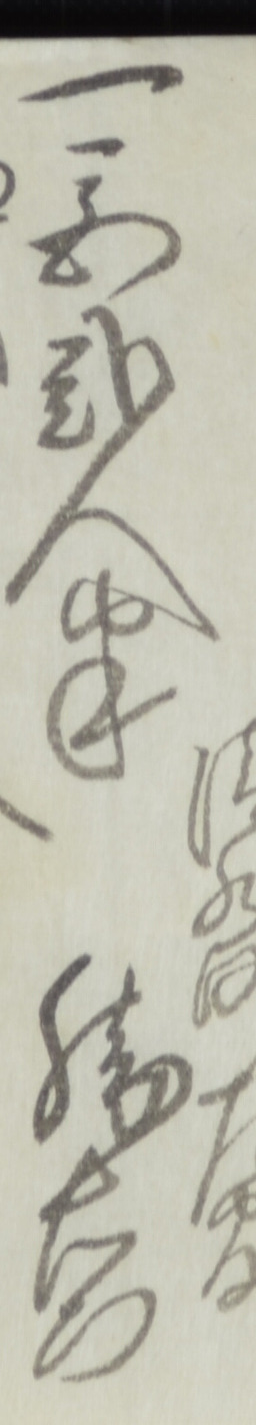一宮弐人半勝右衛門
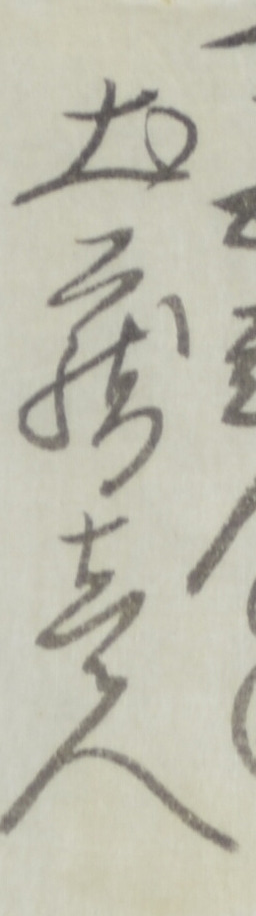土蔵壱人
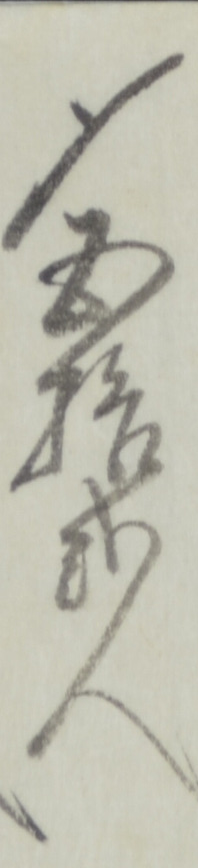〆五拾弐人
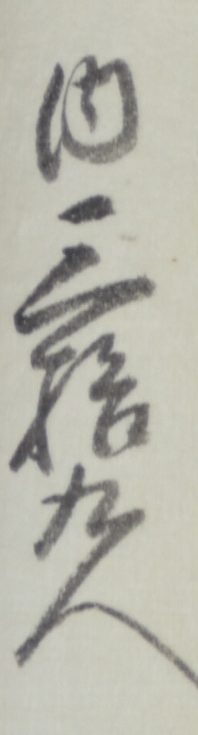内三拾九人

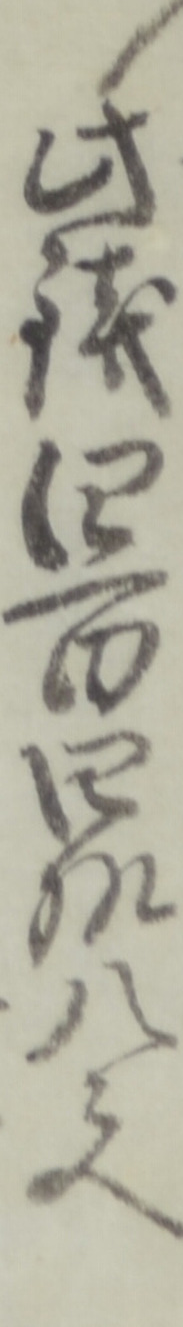此銭四百四拾八文
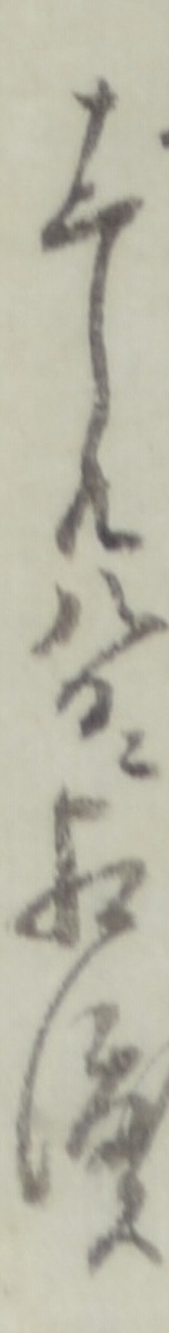十二月廿八日ニ相渡ス
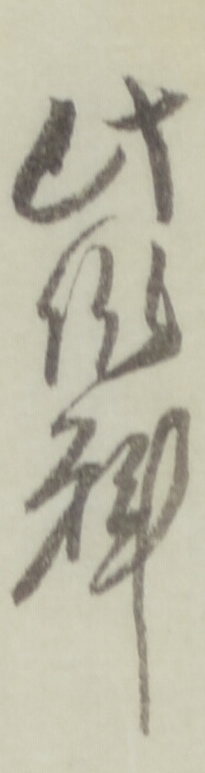此作料
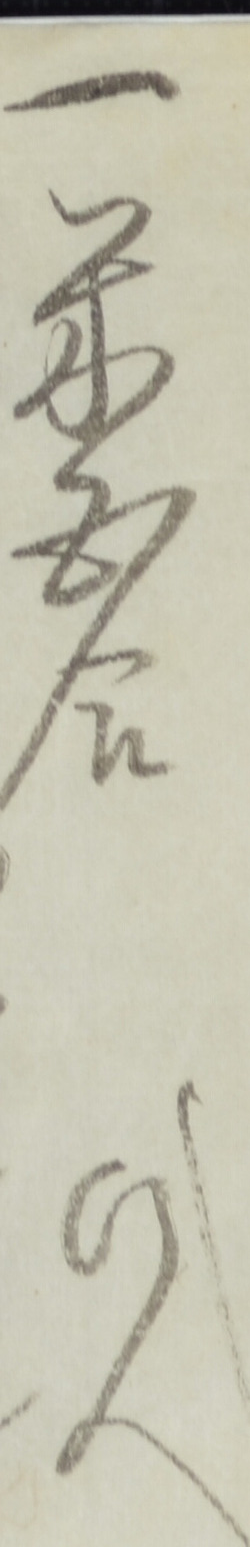一米五合同人
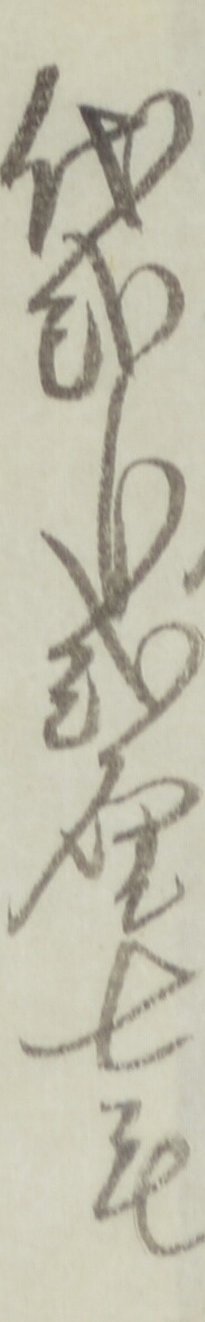代弐分弐厘七毛
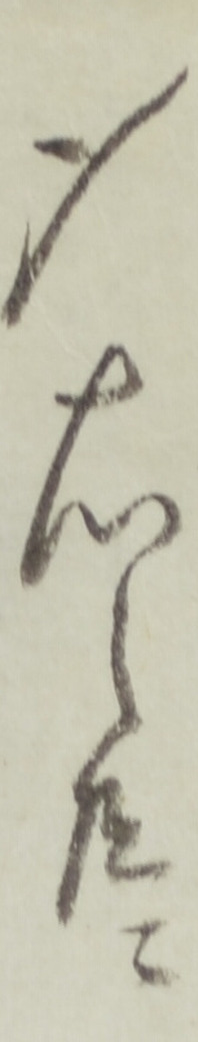〆右之外ニ
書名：権現分拂方
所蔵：伊那市立高遠町図書館・合同会社AMANE
